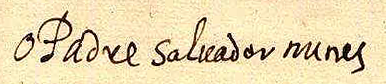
O Padre Saluador nunes
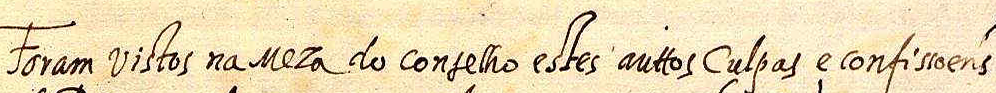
Foram vistos na Meza do conselho estes auttos Culpas e confissoens
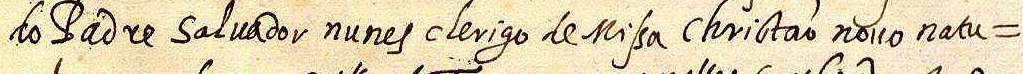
do Padre Saluador nunes clerigo de Missa Christaõ nouo natu
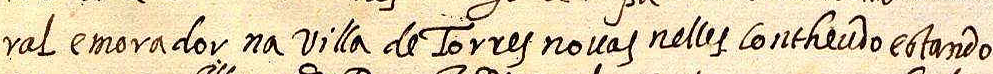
ral e morador na villa de Torres nouas nelles contheudo estando
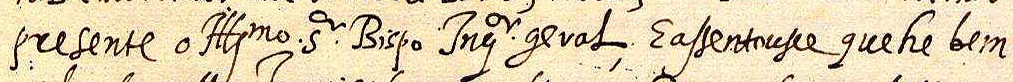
presente o Illꝭmo. sor. Bispo Inqor. geraL, E assentousse que he bem
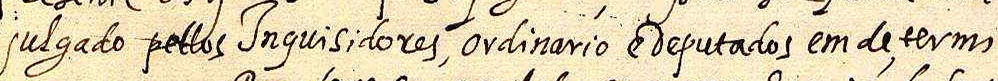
julgado pellos Inquisidores, ordinario e deputados em determi
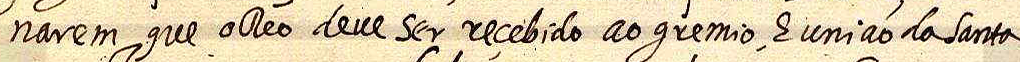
narem que o Reo deue ser reçebido ao gremio, E uniaõ da Santa
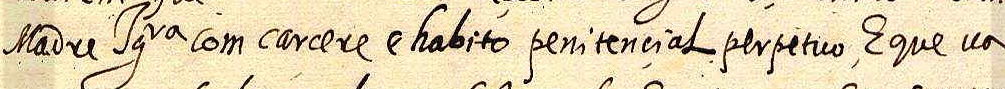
Madre Igra com carcere e habito penitençiaL perpetuo, E que ua
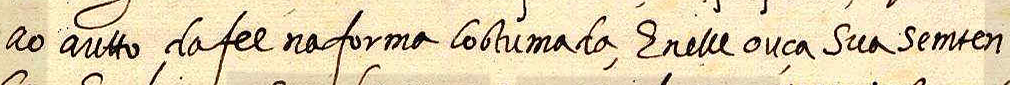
ao autto da fee na forma costumada E nelle ouça sua semten
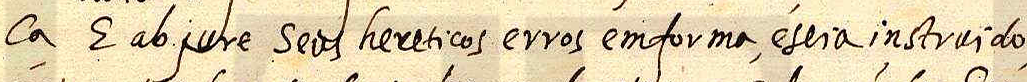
ca E abjure seus hereticos erros em forma, e seia instruido,
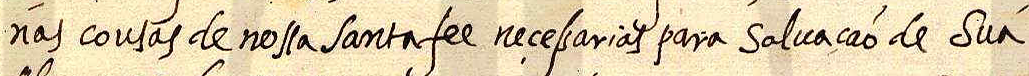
nas cousas de nossa Santa fee neçessarias para saluação de Sua
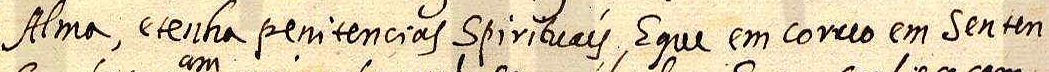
Alma, e tenha penitencias Spirituais, E que emcorreo em Senten
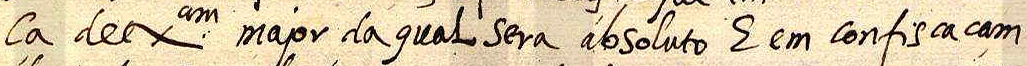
ça de exam. major da quaL sera absoluto E em confiscaçam
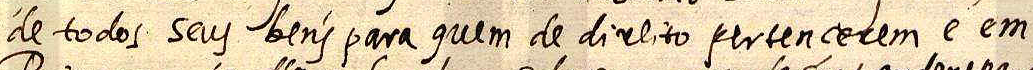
de todos seus bens para quem de direito pertençerem e em
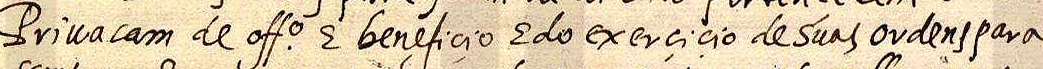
Priuacam de off.o E benefiçio E do exerçicio de suas ordens para
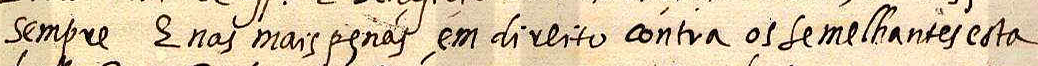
sempre E nas mais penas em direito contra os semelhantes esta
